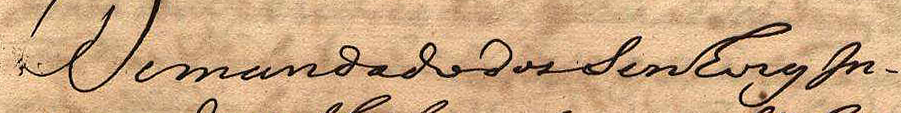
De mandado dos Senhores Jn
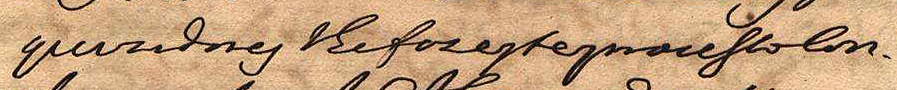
quizidores lhe foi este processo con
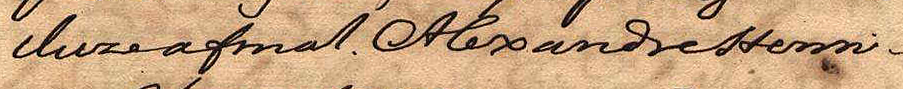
cluzo afinal. Alexandre Henri
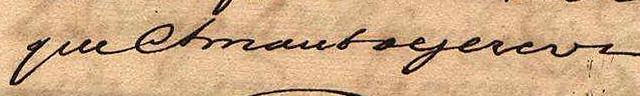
que Arnaut o escrevi
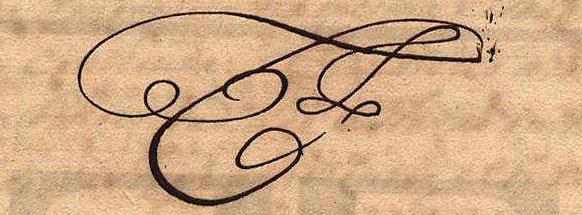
CLo
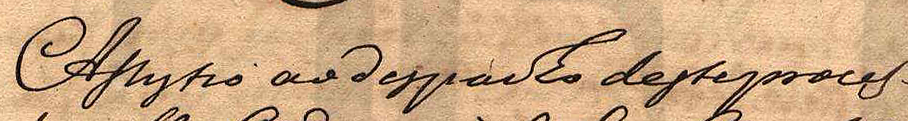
Assistio ao despacho deste proces
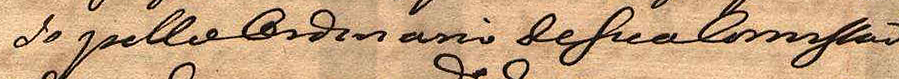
so pello Ordinario de sua comissaõ
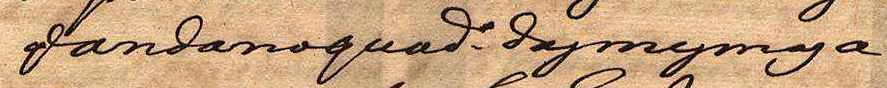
q̄ anda no quad.o das mesmas a
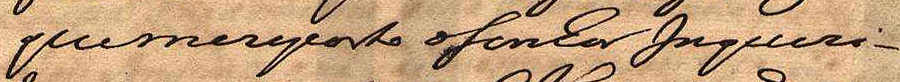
que me reporto o senhor Jnquizi
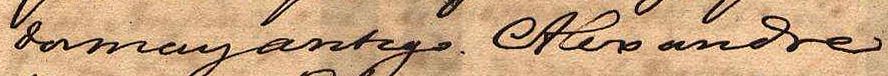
do mais antigo. Alexandre
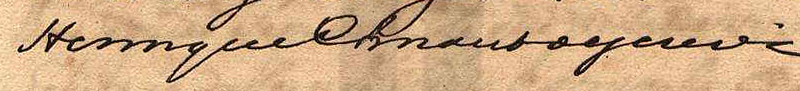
Henrique Arnaut o escrevi
